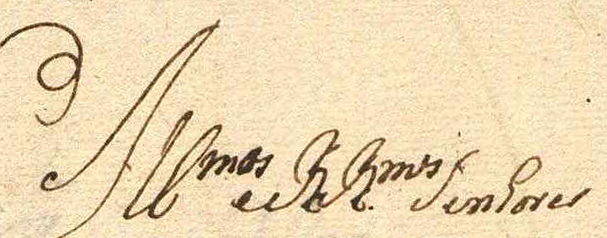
Ill.mos e RR.mos Senhores
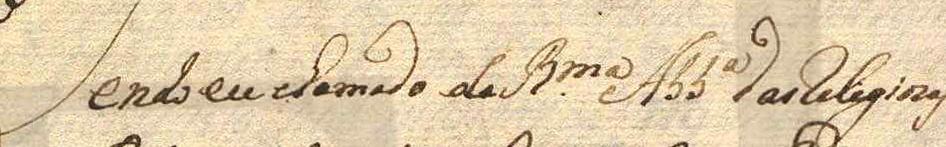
Sendo eu chamado da R.ma Abba das Religiozas
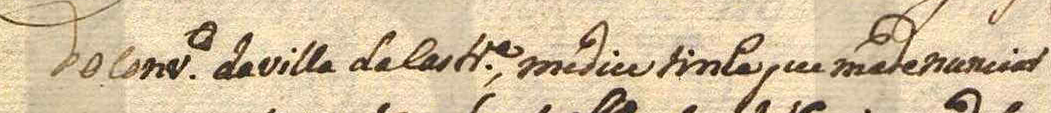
do conv.to da villa da Castr.a, me dice tinha que me denunciar
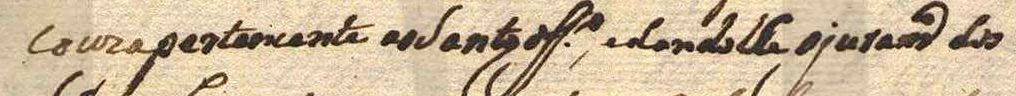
couza pertencente ao Santo off.o, e dandolhe o juramto dos
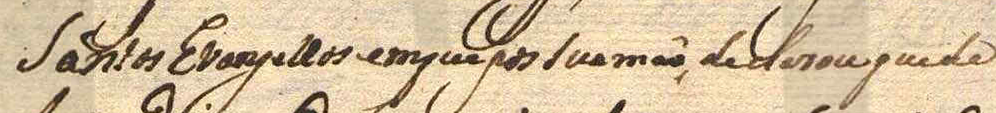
Santos Evangelhos em que pos sua maõ, declarou que de
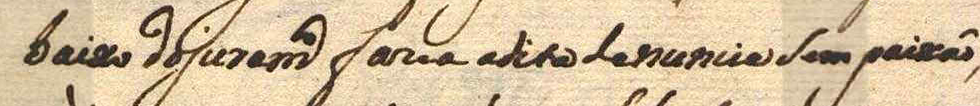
baixo do juramto fazia a dita denuncia sem paixaõ,
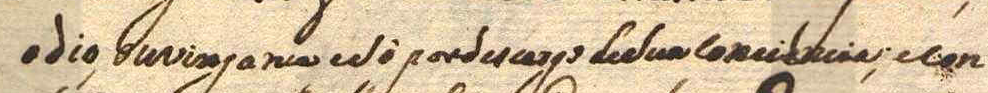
odio, ou vingança e só por descargo de sua conciencia; e con
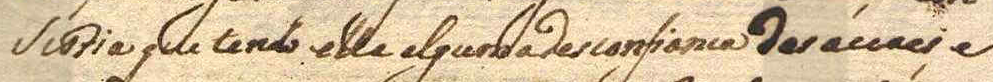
Sestia que tendo ella alguma desconfiança das acçoes, e
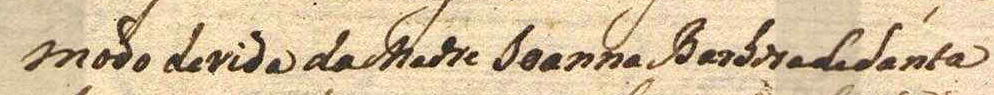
modo de vida da Madre Ioanna Barbosa de Santa
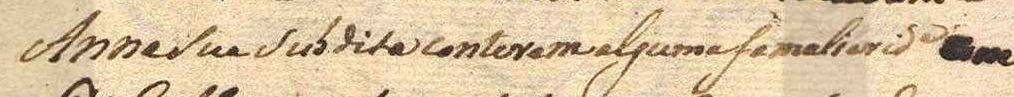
Anna sua subdita conterem alguma femaliaride com
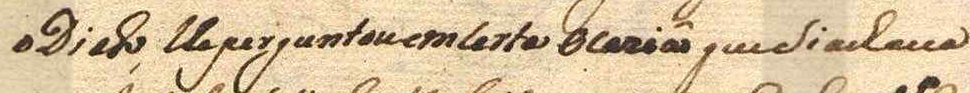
o Diabo, lhe perguntou em certa ocaziaõ que si achaua
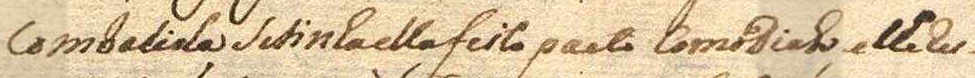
combalida, se tinha ella feito pacto como Diabo, e lhe res
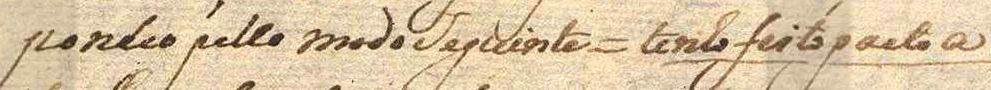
pondeo pello modo seguinte = tenho feito pacto a
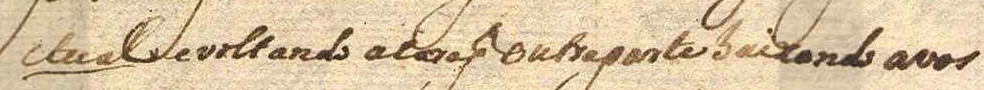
ctual e voltando a cara pa outra parte baixando a vos
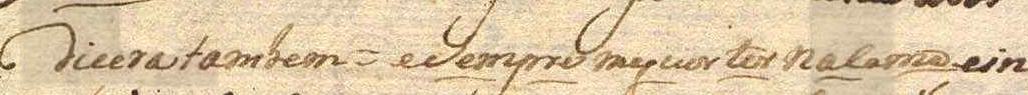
dicera tambem = e sempre me quer ter na cama, e in
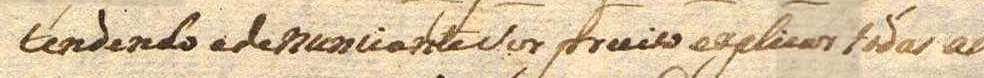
tendendo o denunciante ser preciso explicar todas as
